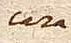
caza
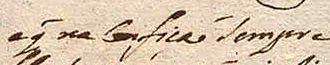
a q̄ na confiçaõ sempre
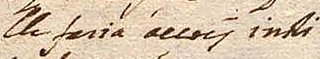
lhe fazia acçoēs indi
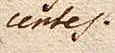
centes.
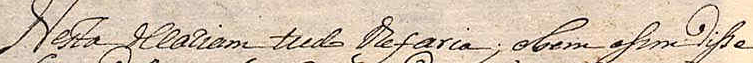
Nesta occaziam tudo lhe faria, e bem asim disse
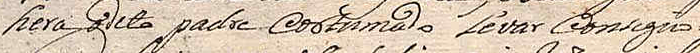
hera o dito padre costumado Levar consiguo
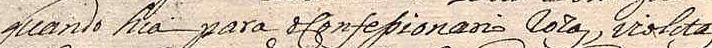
quando hia para o Confessionario rozas, violetas
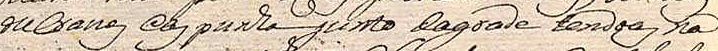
ou crauos e as punha junto da grade tendoas na
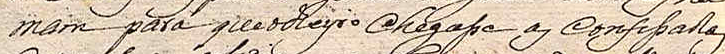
mam para que o cheyro chegasse as confessadas
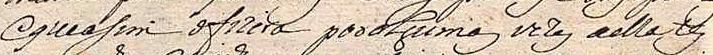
e que asim o fizera por algumas vezes a ella tes
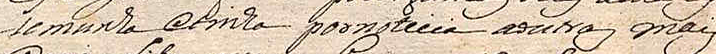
temunha e tinha por noticia a outras mais
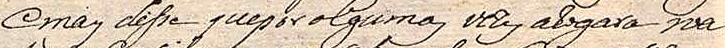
E mais disse que por algumas vezes a rogara no a
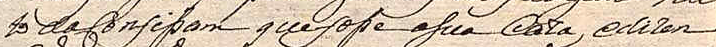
to da Confissam que fosse a sua caza, e dizen
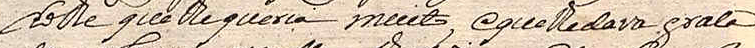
dolhe que lhe queria muito, e que lhe dava graca
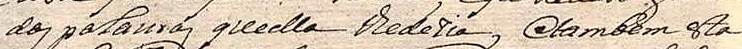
das palauras que ella lhe dezia, e tambem esta
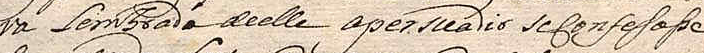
va lembrada de elle a persuadir se confesasse
